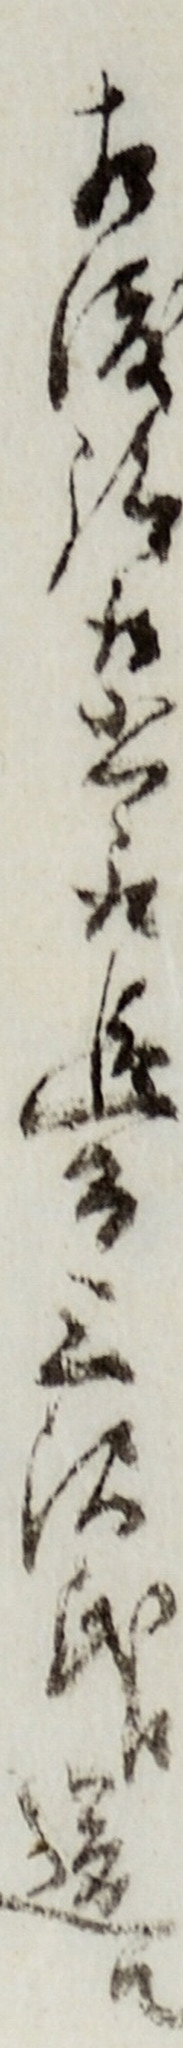相渡請取書取追而三沢氏江送ル
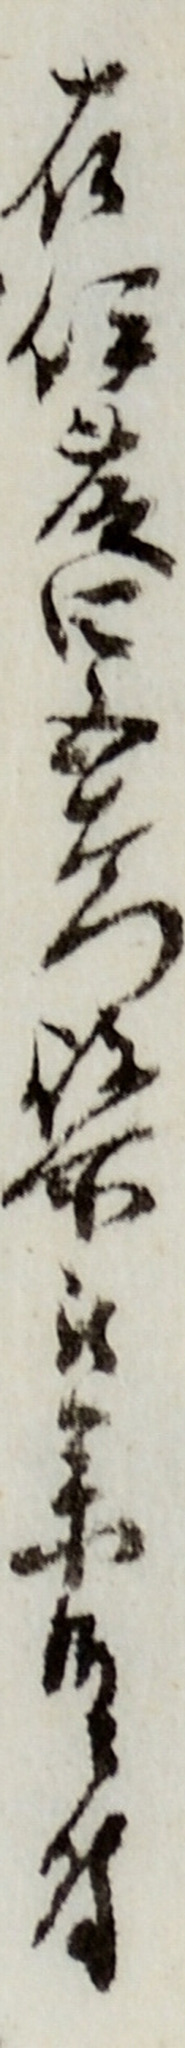右伊藤仁五右衛門役所江参候二付
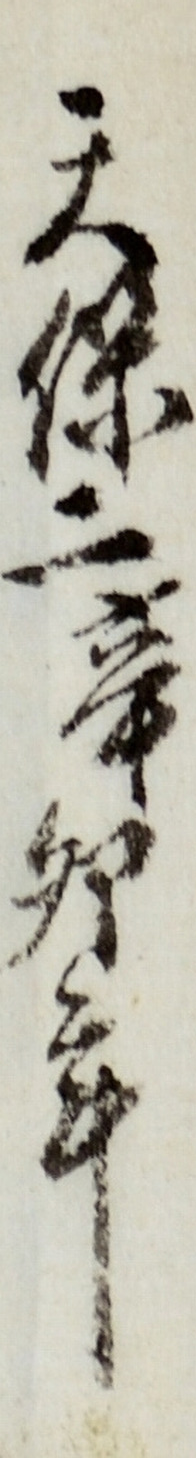天保二辛卯年
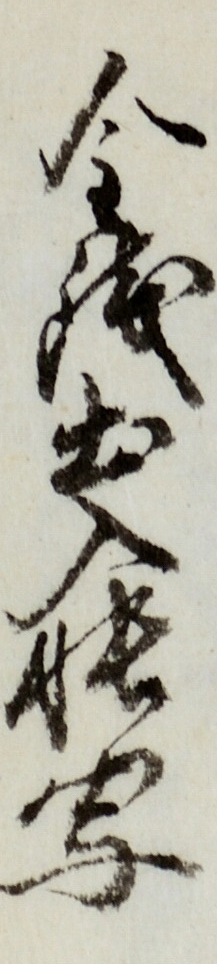金銭出入帳写
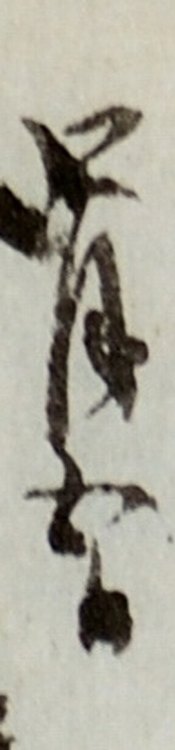四月五日
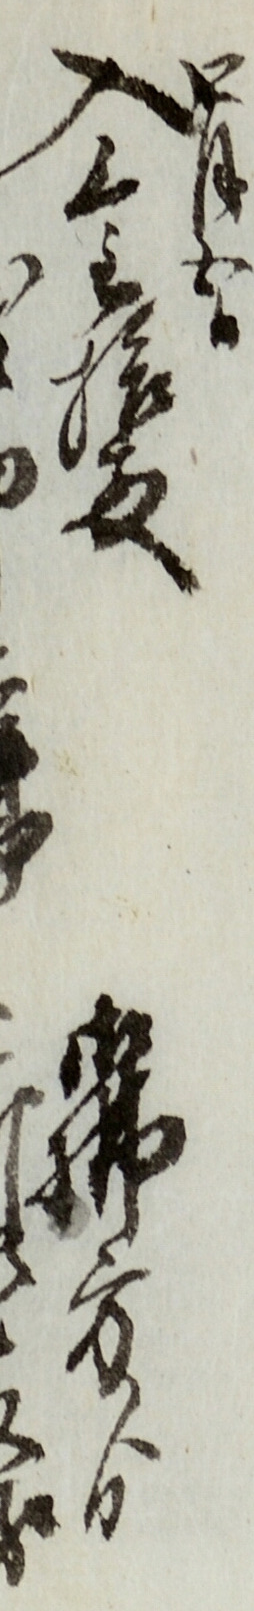入金拾両御払方より
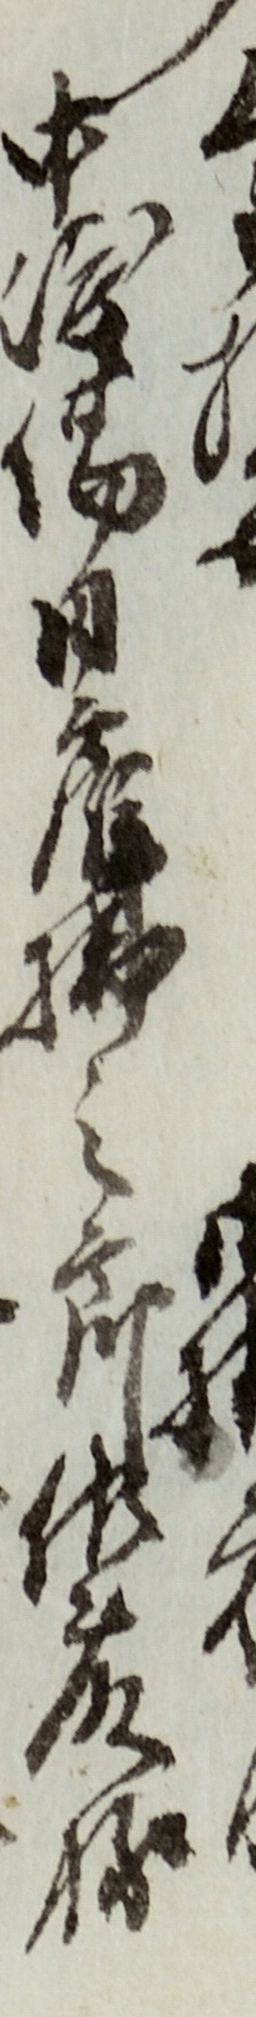中崎渡場日雇払之節佐藤様
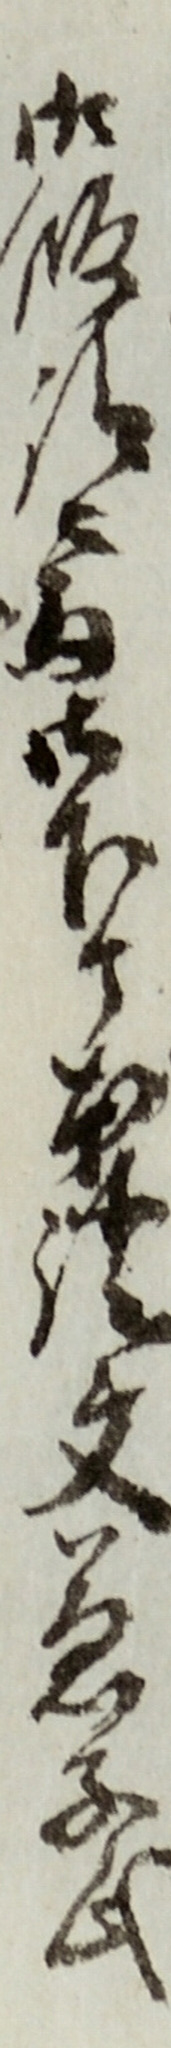御飯請二而御下ケ本證文兼子氏
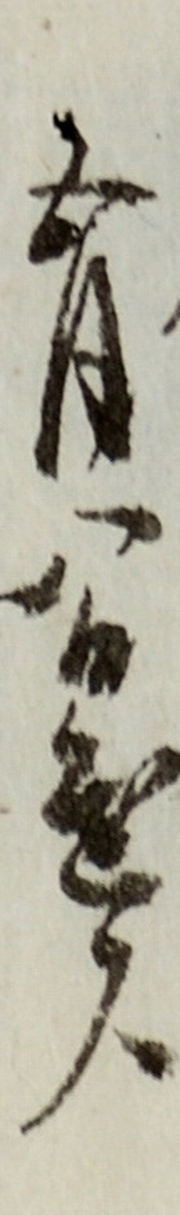五月八日遣ㇲ
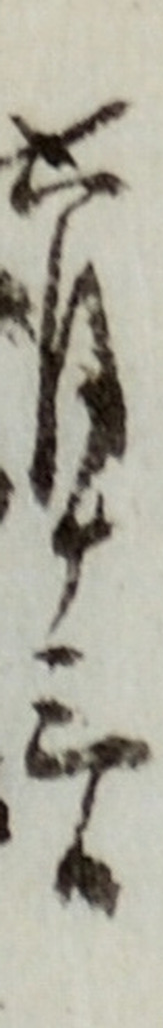六月十三日
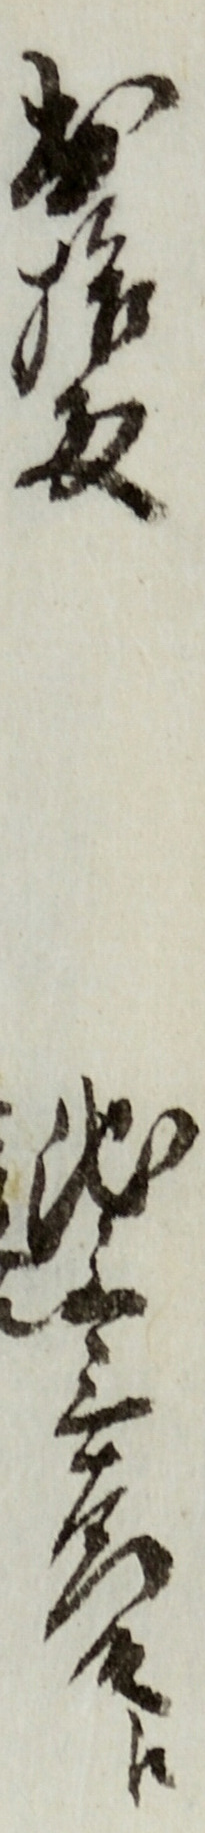出拾両池上三右衛門殿江
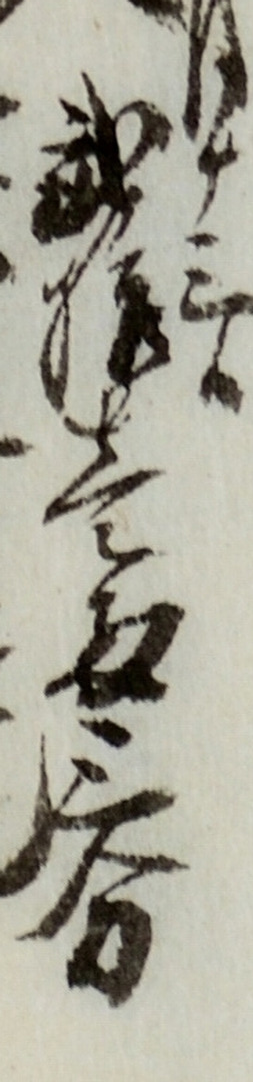入弐拾壱両三分
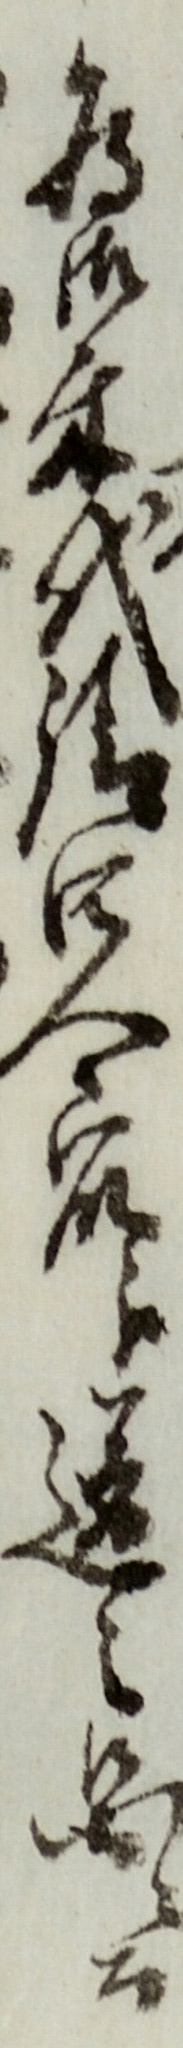為御米代請四人衆江送之図二而
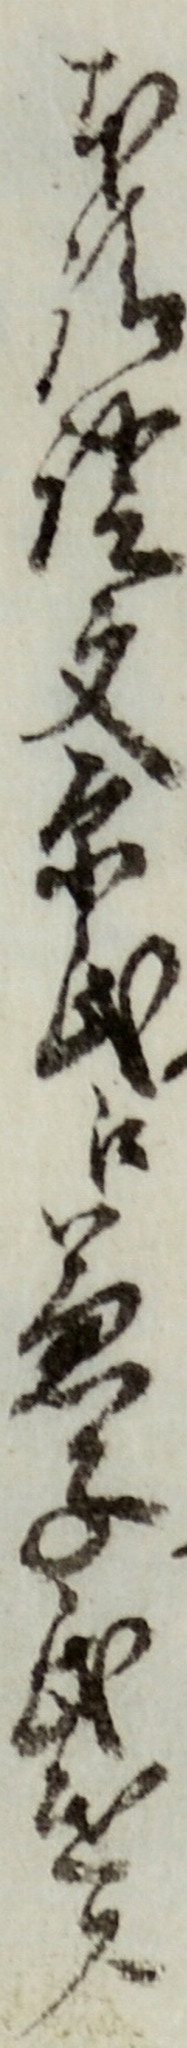本請證文原氏江兼子氏遣ㇲ

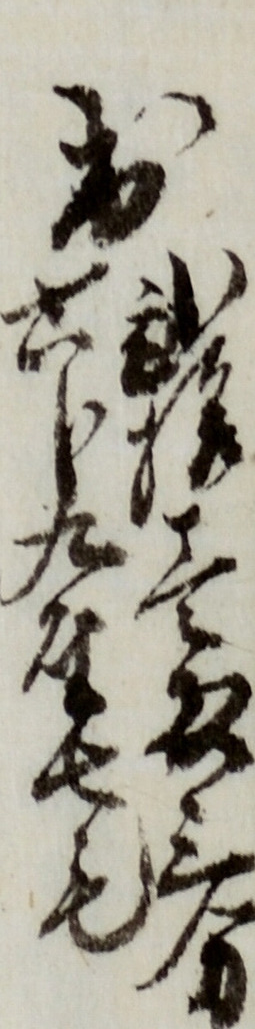六歩九厘七毛
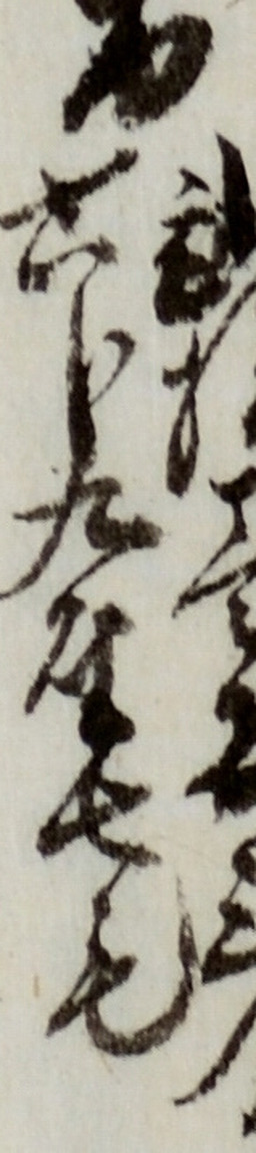六歩九厘七毛
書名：中沢郷御竹薮見廻り
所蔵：伊那市立高遠町図書館・合同会社AMANE
